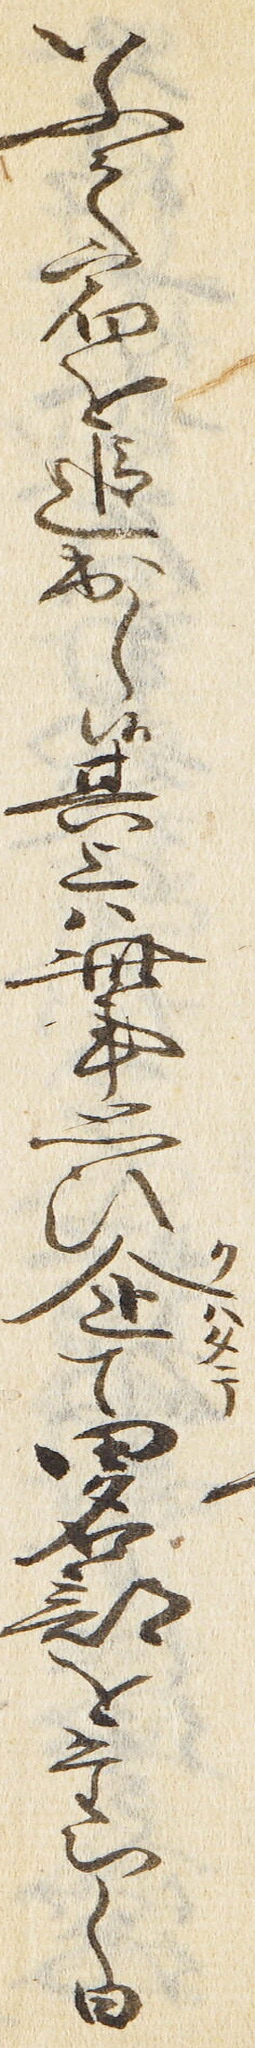いふて宿を追出し候其上は此事思ひ企て田名部をたちし日
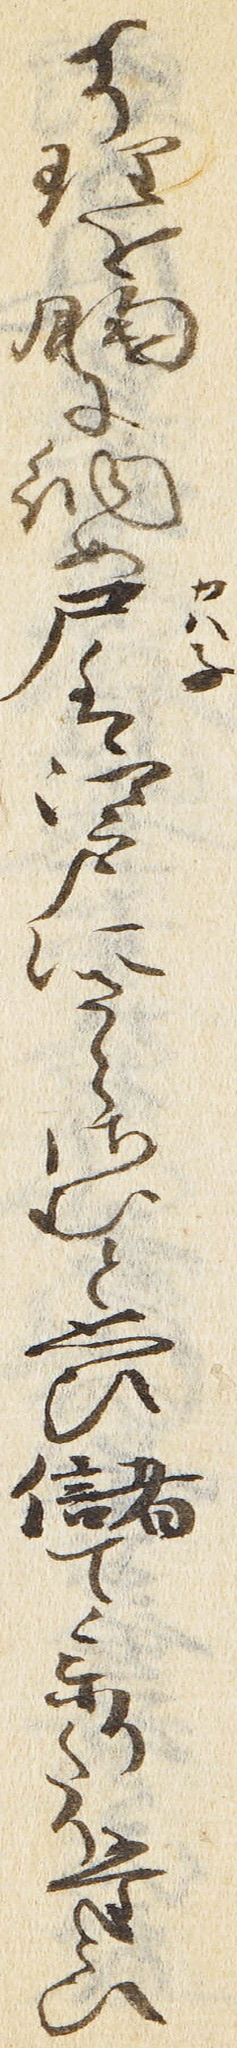より理を胸に納め屍は江戸にさらさむと思ひ儲て参りたりたとひ
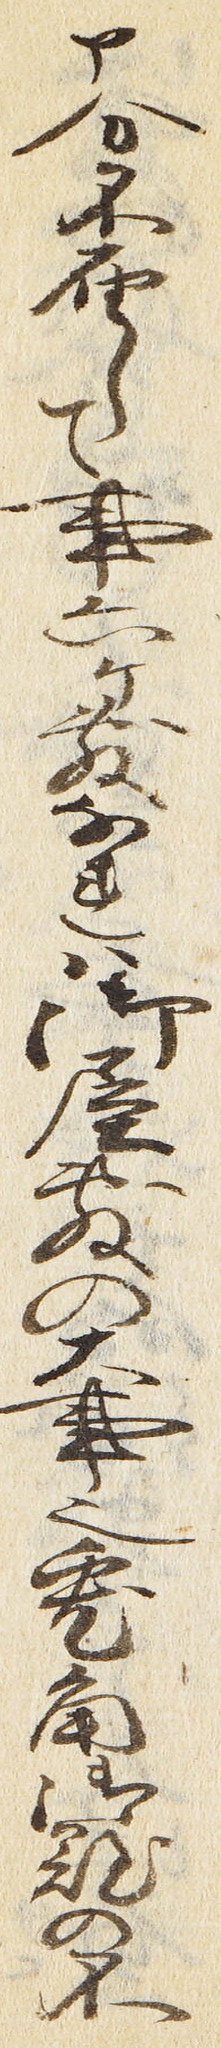申分不届して事六ケ敷なれは御屋敷の大事也兎角御難の不
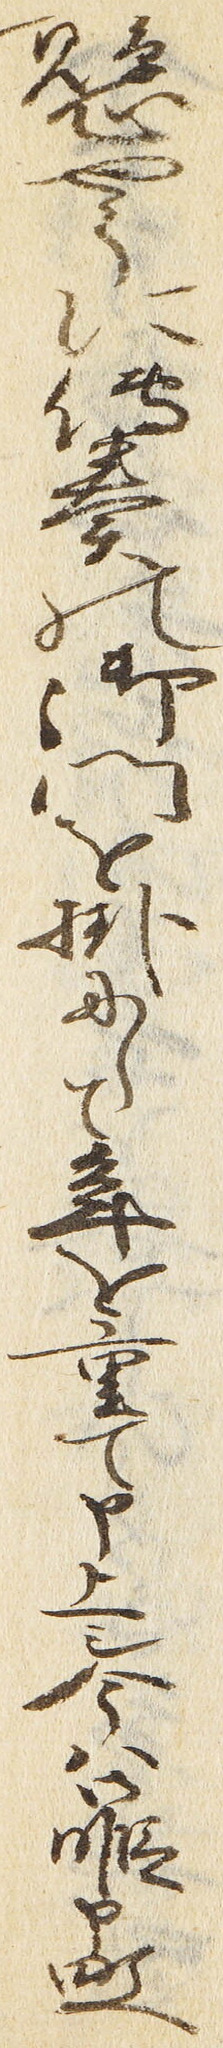懸やうに伝奏の御門を掛にして年を重て申上シ今は御暇申町へ
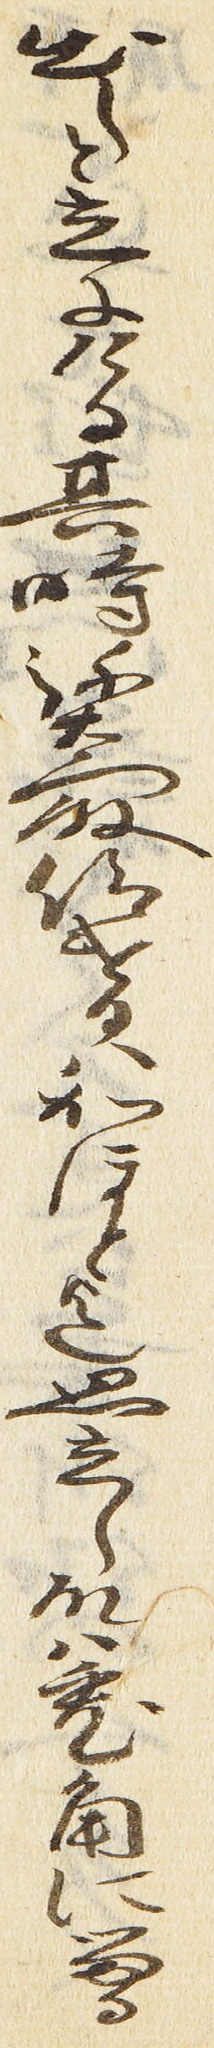出しと立にける其時弥右衛門殿仰けるはかほと迄思立し故は兎角に留る
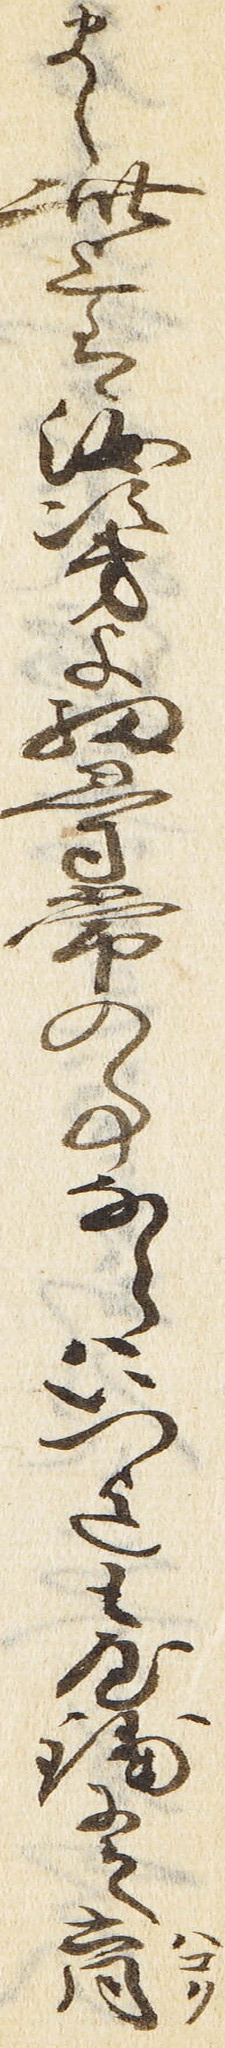まし此上は汝次第よ扨尋常の事ならはいつ迄も屋鋪にて育
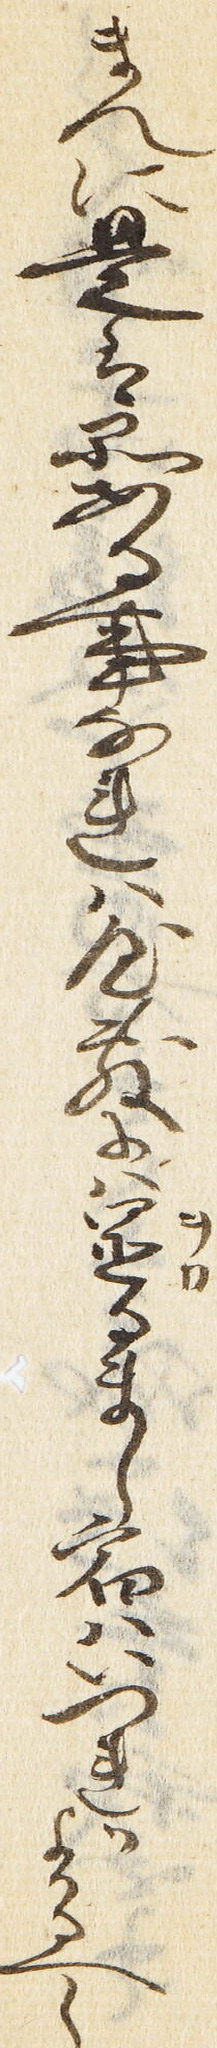まんに是は品ある事なれは屋敷には置るまし宿はいつれかよかるへし
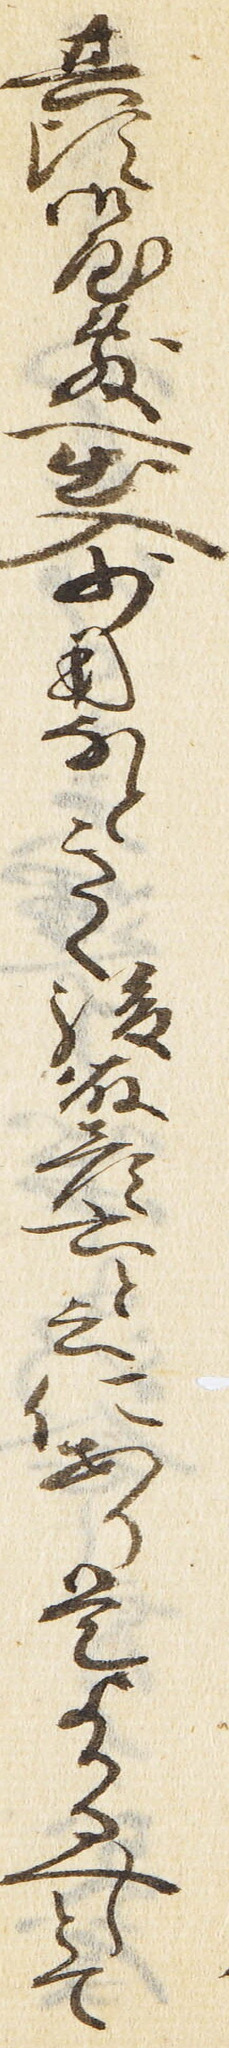其頃御屋敷へ出入少用なときく後藤彦六と云仁あり是よかるへしとて
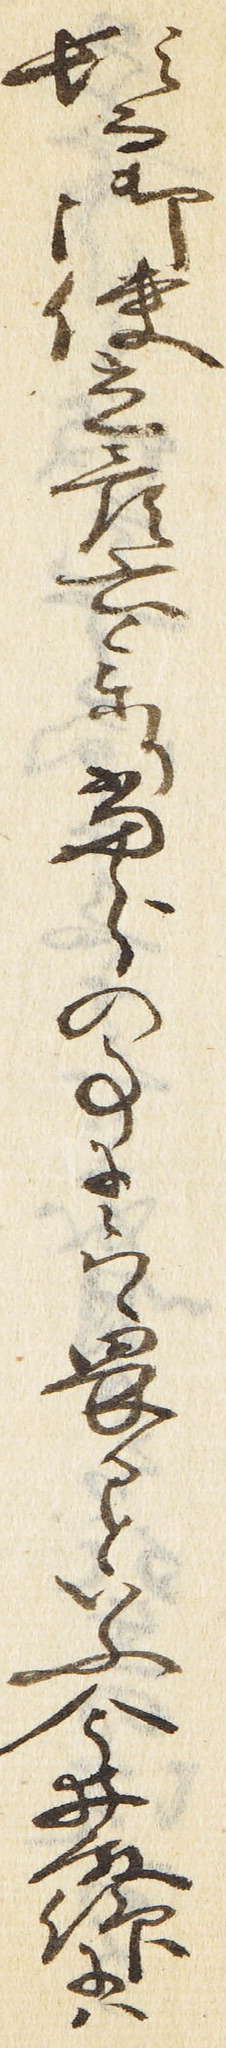頓而御使立彦六参り当分の事に候はゝ畏るといふ今井殿仰には
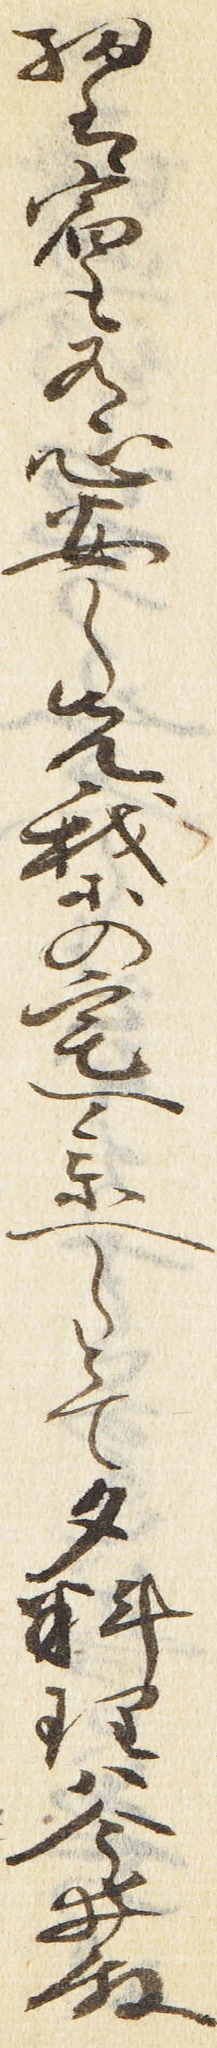扨は宿も有心安く先我等の宅へ参へしとて夕料理は今井殿
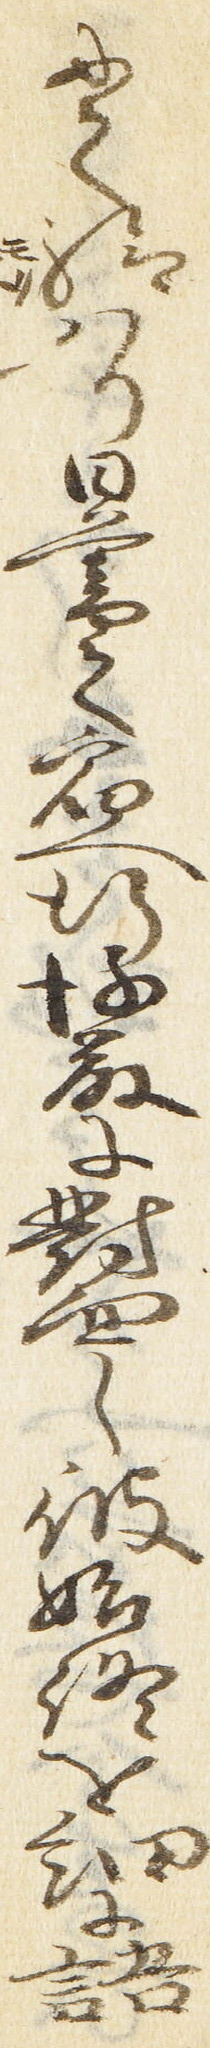にて給はり日暮て宿へ行後藤に対面し彼始終を細に語
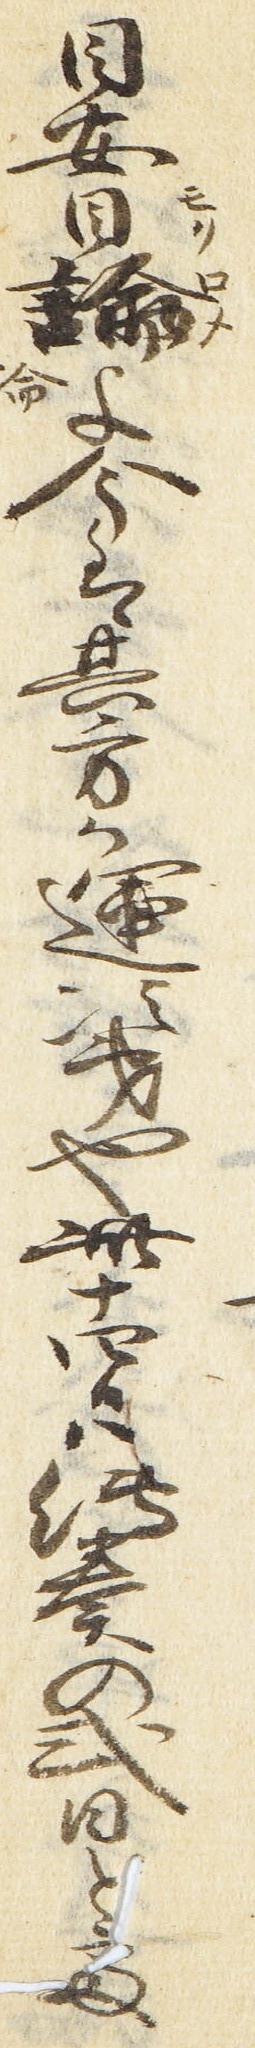目安目論に今は其方か運次第也此十四日は伝奏の式日とて

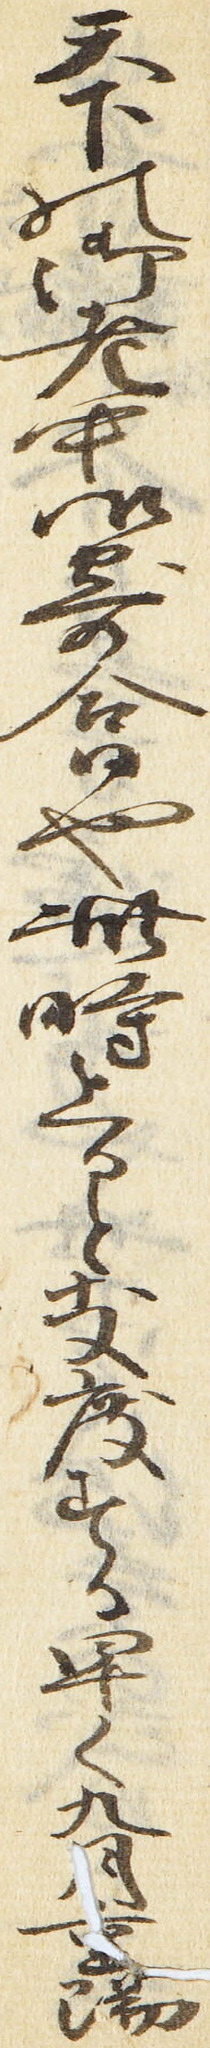天下の御老中御寄合日也此時上ると支度する早く九月重陽
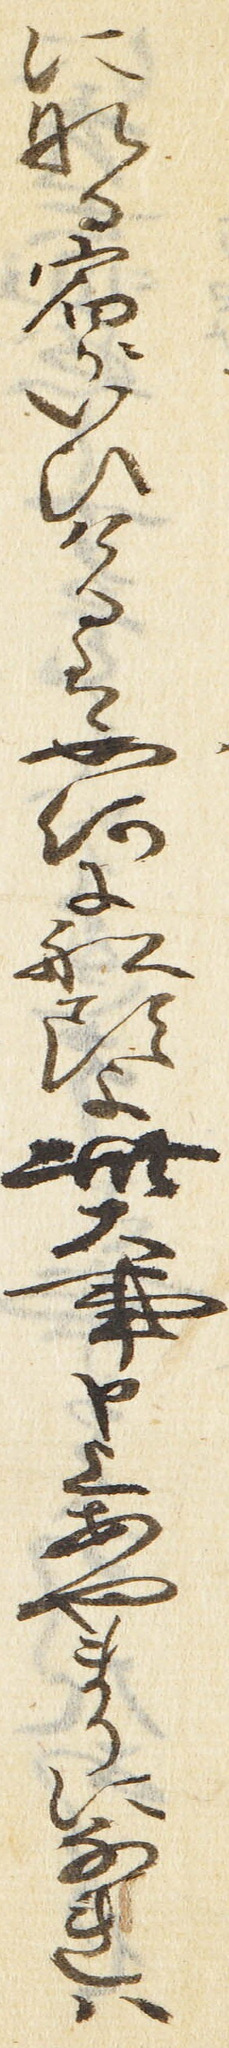になる宿がいひけるは如何に船頭よ此大事申上あやまりになれは
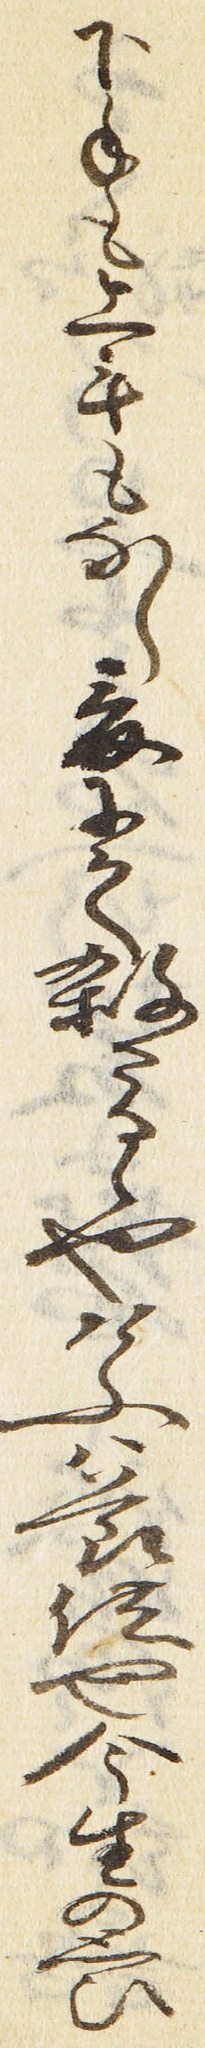下手も上手もなし爰にて殺さるゝやけふは節法也今生の思ひ
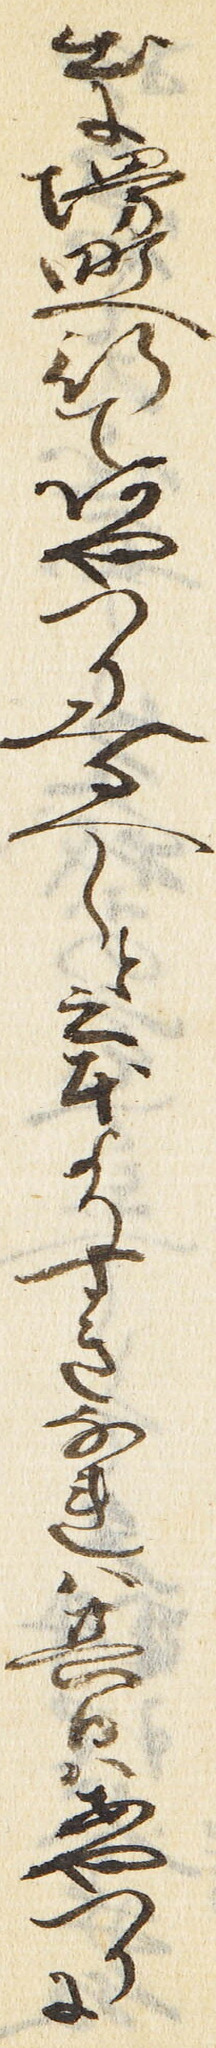出に堺町へ行てあやつりみるへしと云本よりすきなれは其日はあやつりに
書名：海陸世話日記
